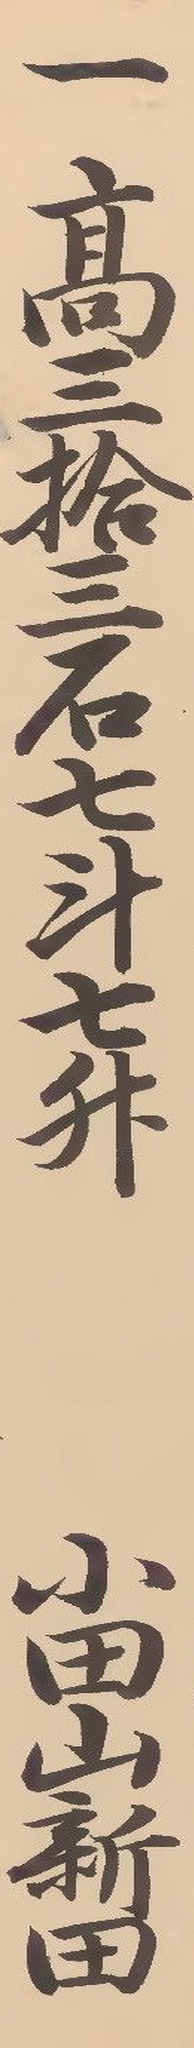一高三拾三石七斗七升小田山新田
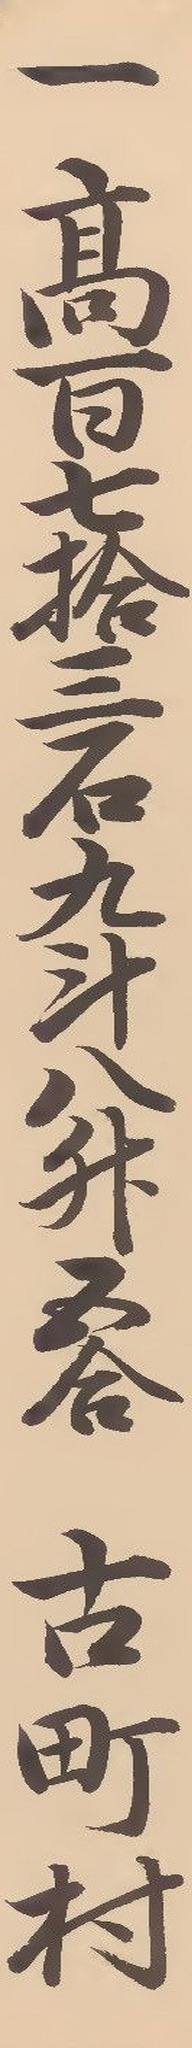一高百七拾三石九斗八升五合古町村
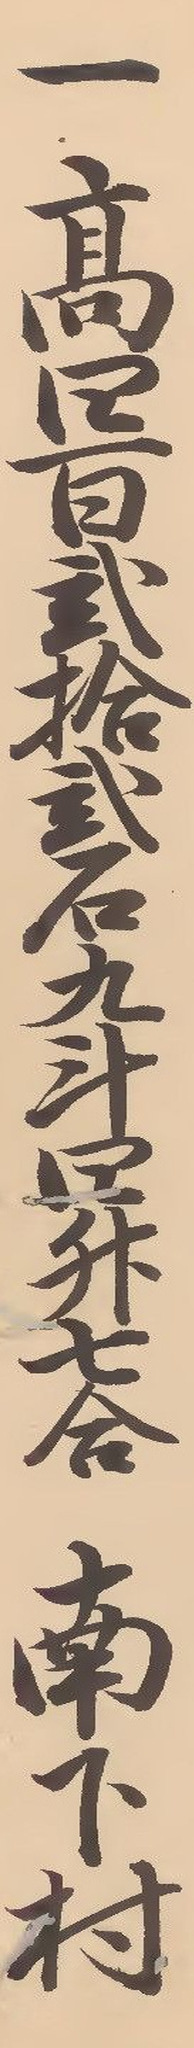一高四百弐拾弐石九斗四升七合南下村

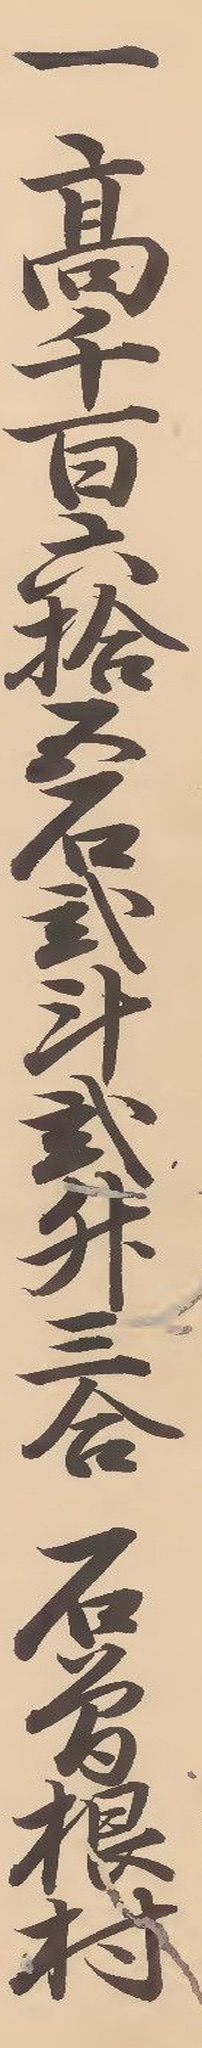一高千百六拾五石弐斗弐升三合石曽根村
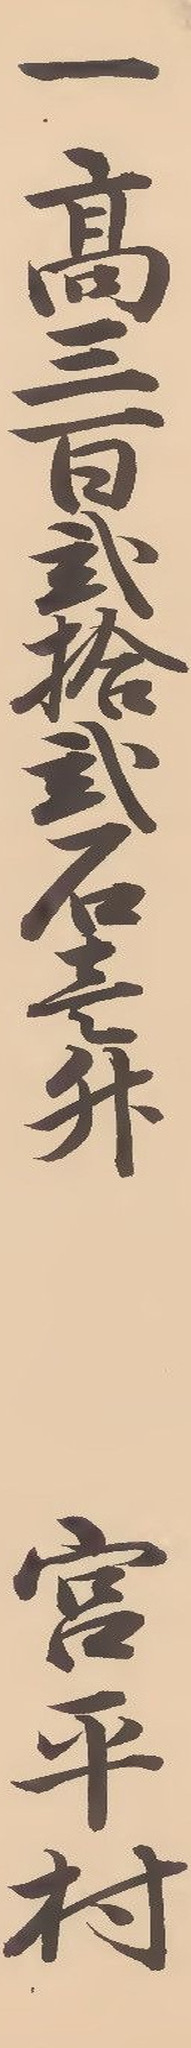一高三百弐拾弐石壱升宮平村
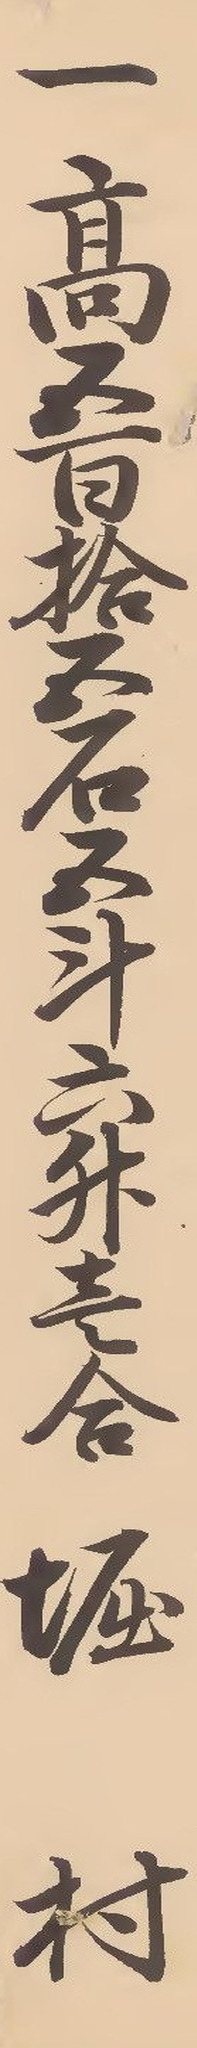一高五百拾五石五斗六升壱合堀村
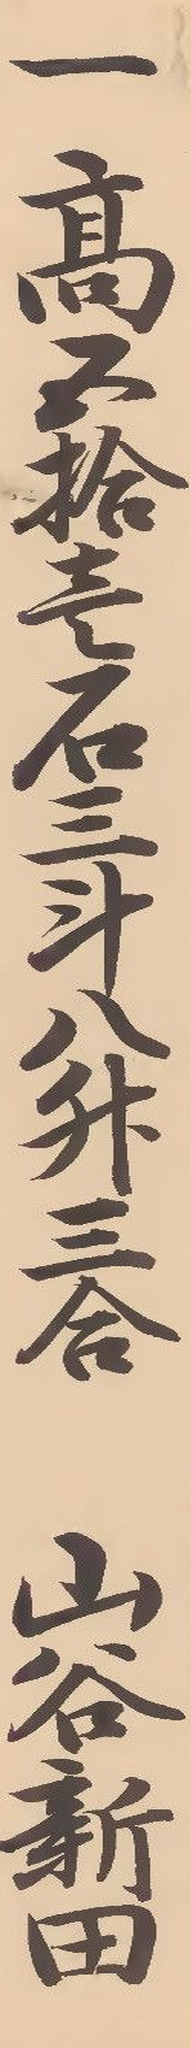一高五拾壱石三斗八升三合山谷新田
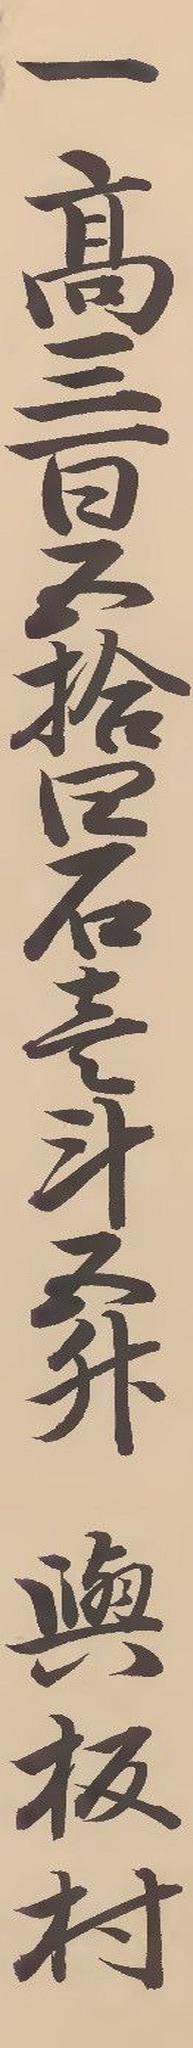一高三百五拾四石壱斗五升與板村
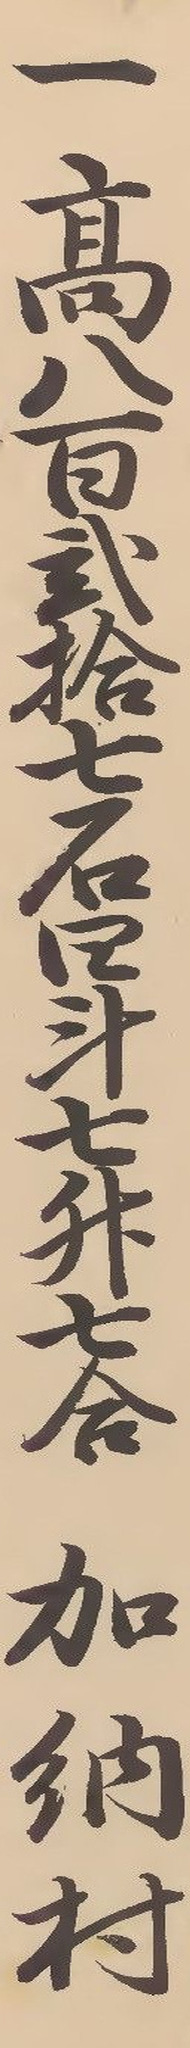一高八百弐拾七石四斗七升七合加納村
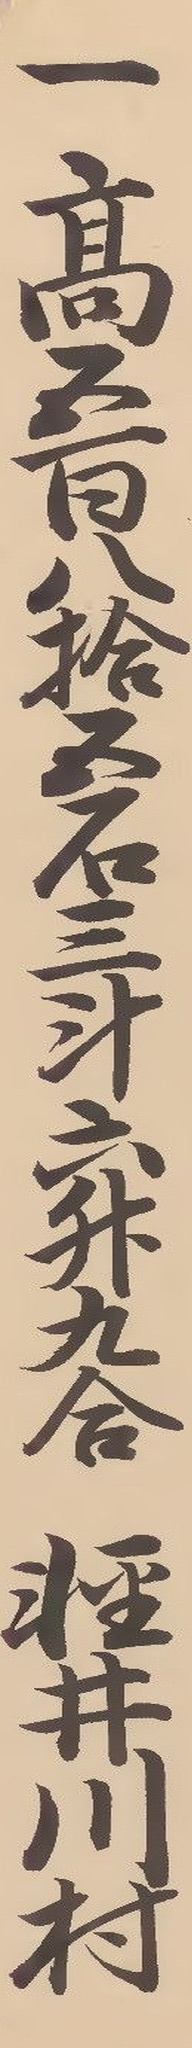一高五百八拾五石三斗六升九合軽井川村
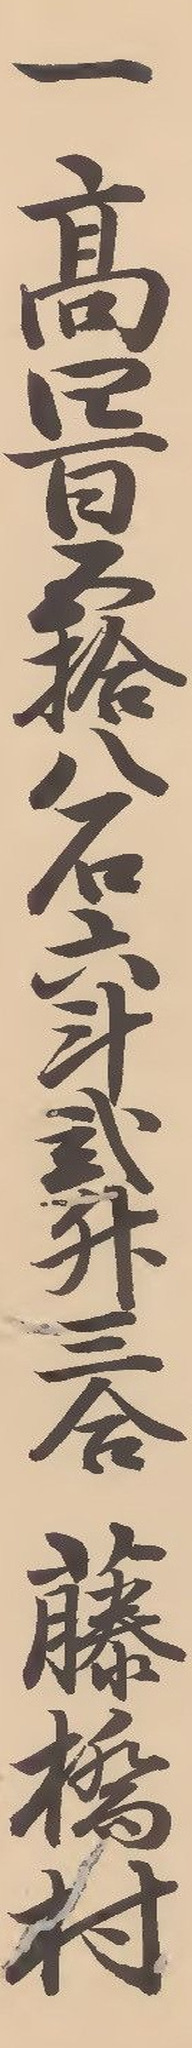一高四百五拾八石六斗弐升三合藤橋村

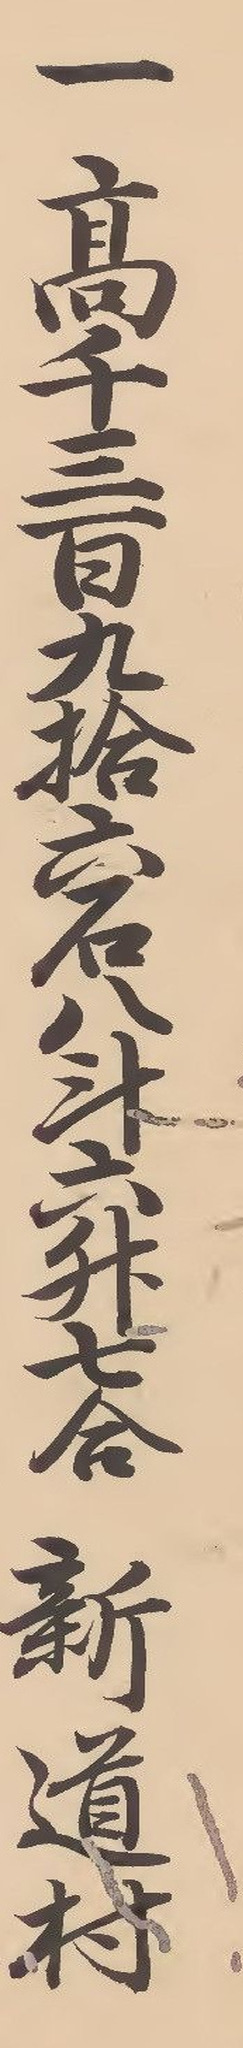一高千三百九拾六石八斗六升七合新道村
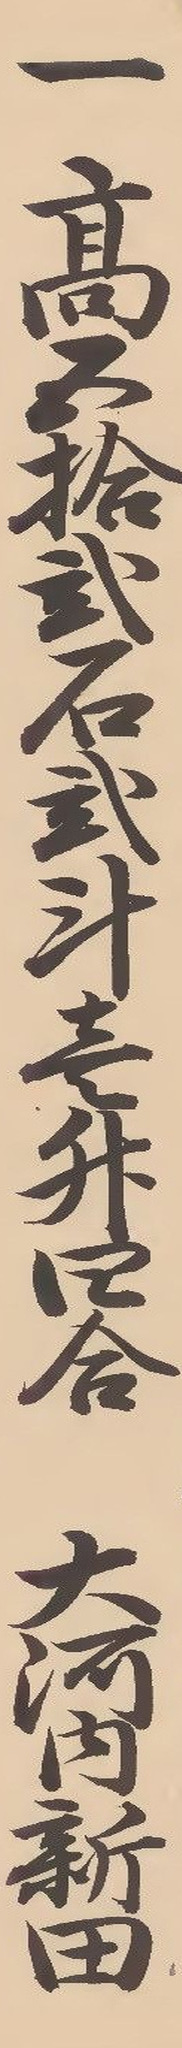一高五拾弐石弐斗壱升四合大河内新田
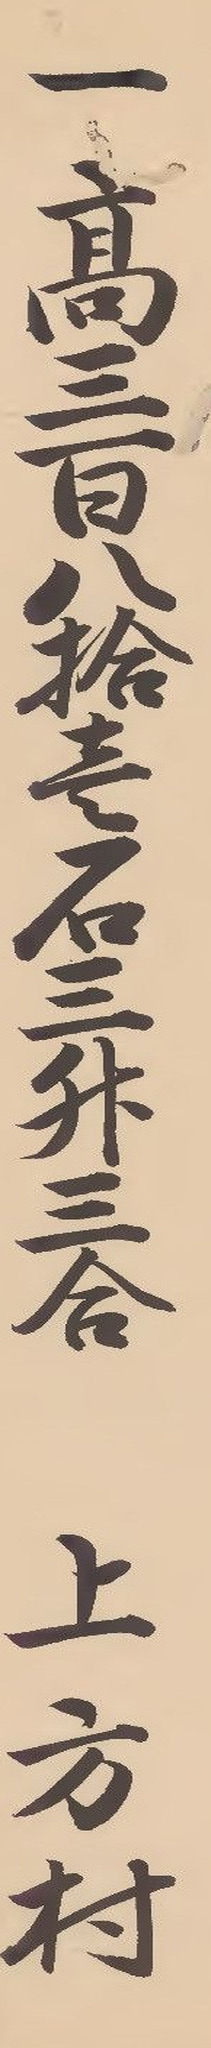一高三百八拾壱石三升三合上方村
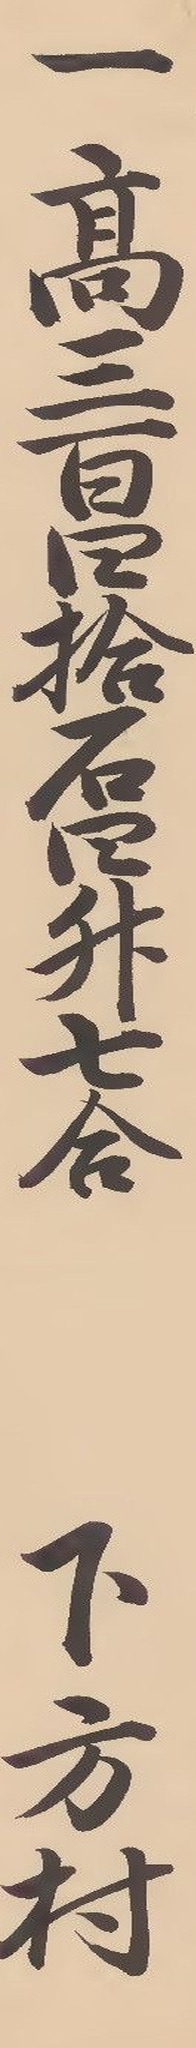一高三百四拾石四升七合下方村
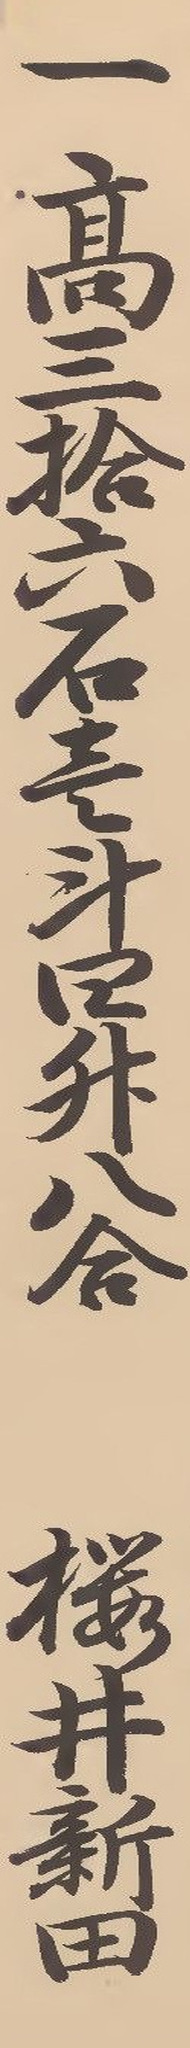一高三拾六石壱斗四升八合桜井新田
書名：越後国郷帳　中
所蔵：国立公文書館 National Archives of Japan
